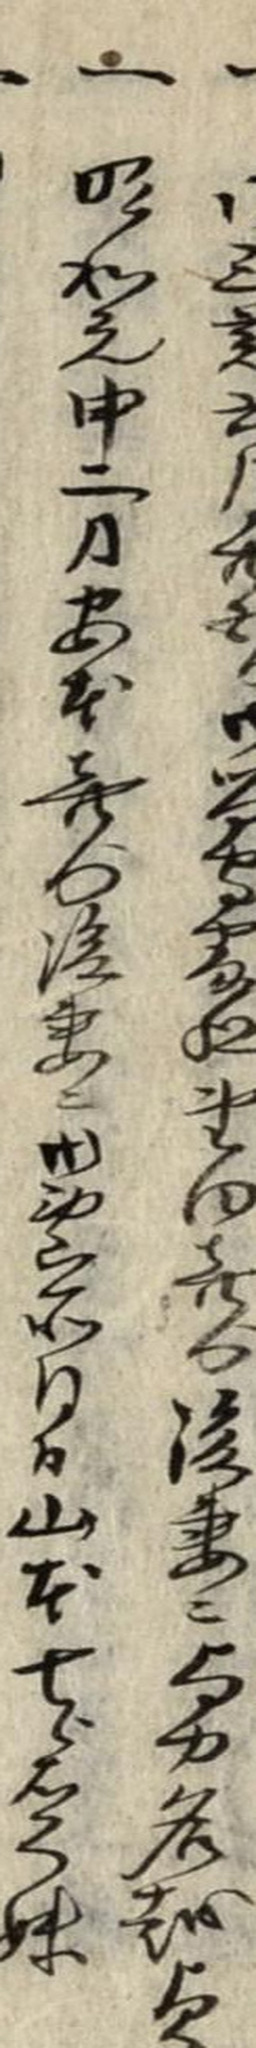一明和元申二月安本喜右衛門後妻ニ御台所目付山本七郎右衛門妹
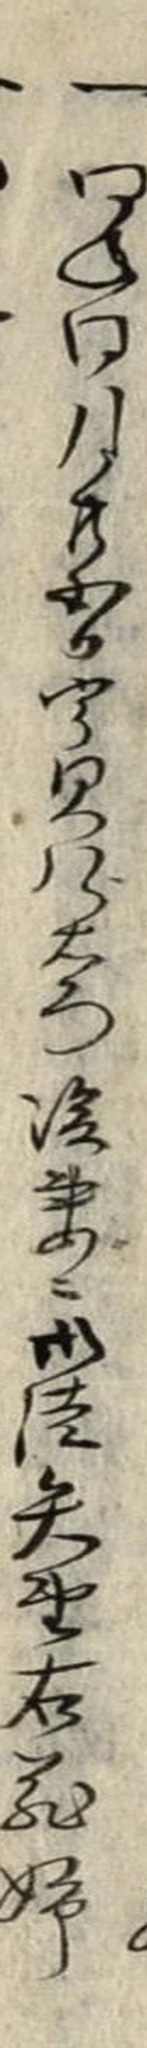一同年同月廿五日宇貝八郎右衛門後妻ニ御徒矢野右蔵姉
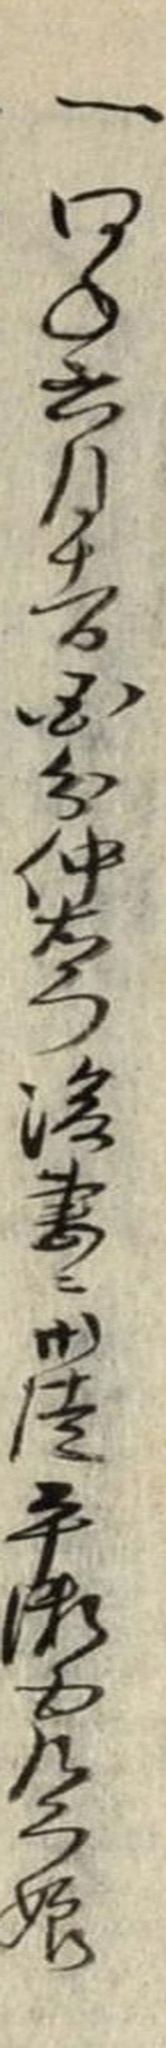一同年六月十一日国分仲右衛門後妻ニ御徒平瀬五左衛門娘
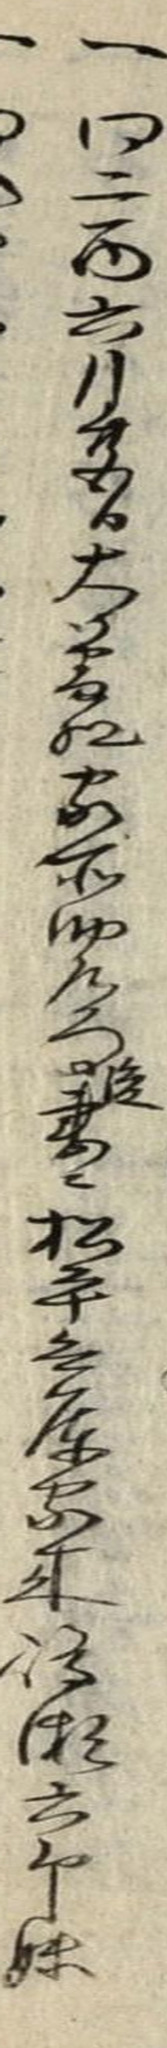一同二酉六月廿五日大御番組家所助左衛門後妻ニ松平兵庫家来嶋瀬六郎妹
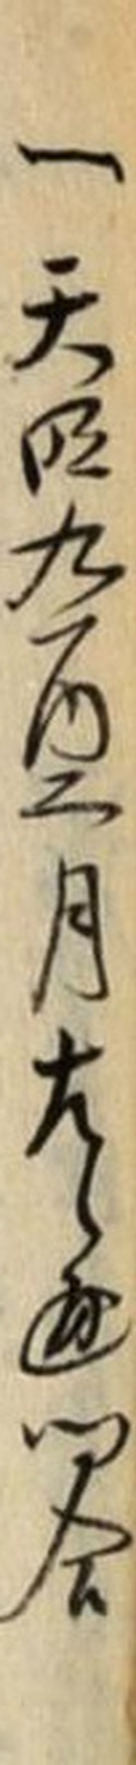一天明九酉二月左之通問合
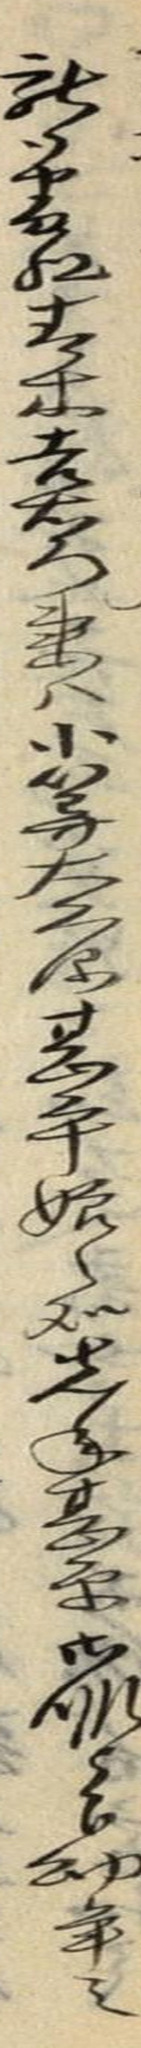新御番組春木吉右衛門妻ハ小算大久保甚平娘之処先年甚平御暇被下幼年之
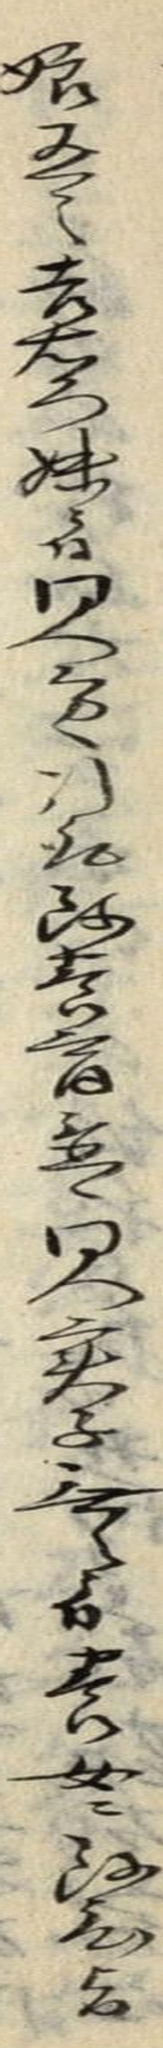娘有之吉右衛門妹ニ付同人方へ引取致養育置候同人実子無之ニ付養女ニ致度旨
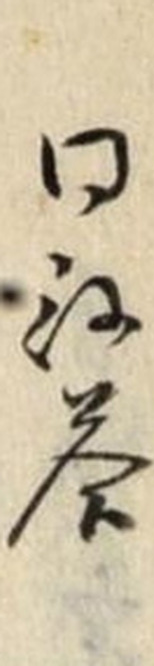同役答
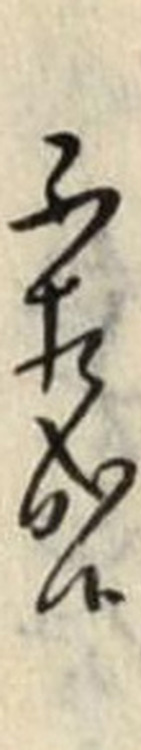不相成候
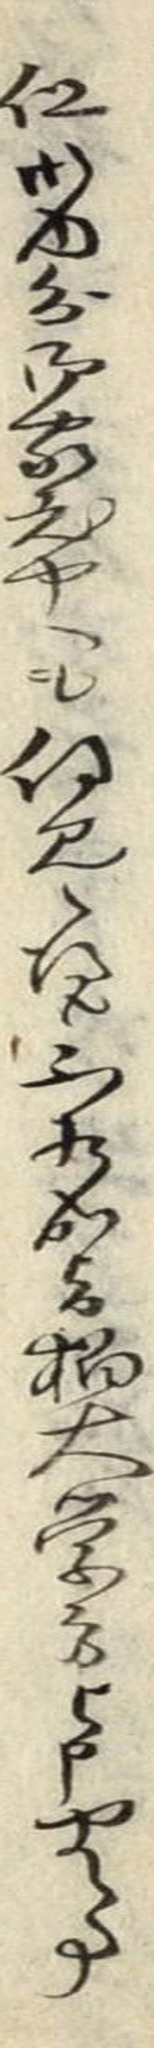但御内分御家老中へも伺見候得共不相成旨狛大学方被申聞候事
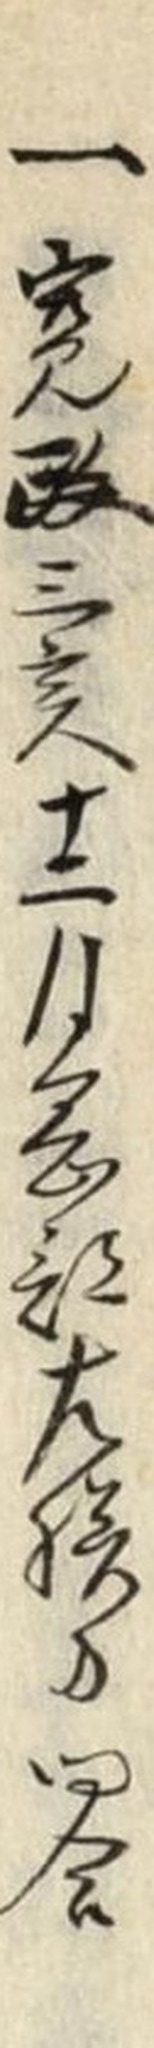一寛政三亥十二月岡部左膳方問合
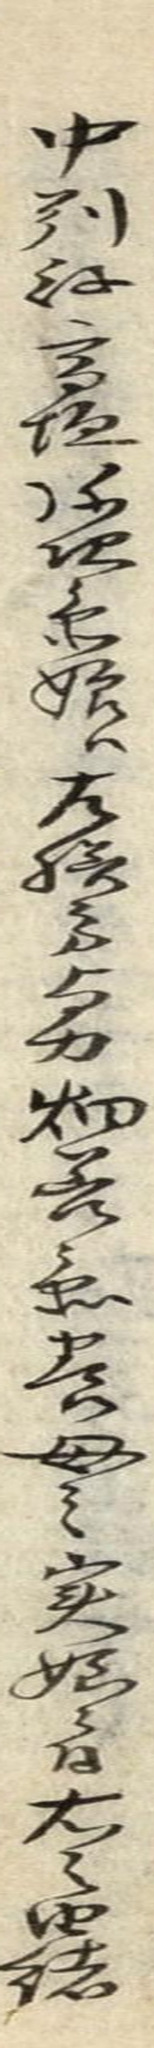中判役高垣弥次兵衛娘ハ左膳方与力畑善兵衛養母之実娘ニ付右之由緒
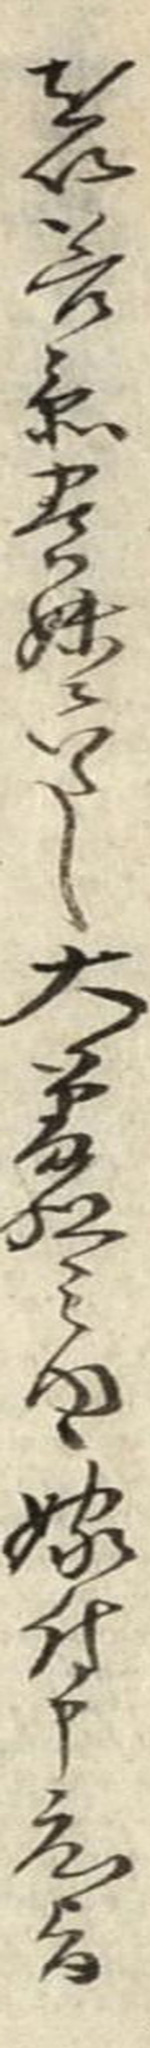を以善兵衛養妹ニいたし大御番組之内へ嫁付申度旨
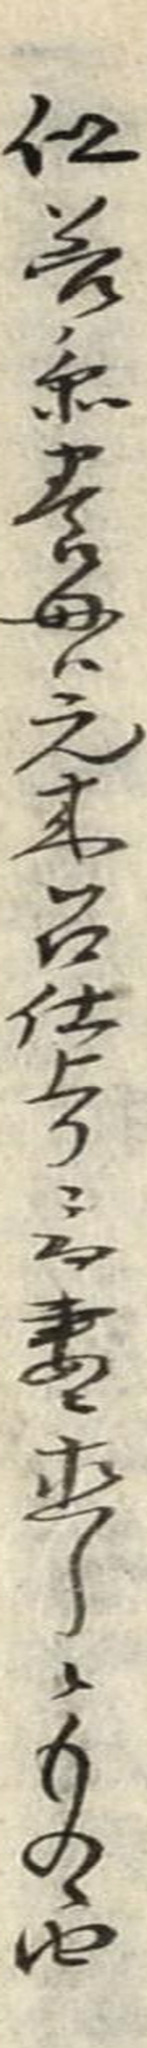但善兵衛養母ハ元来召仕上りに而妻ニ直し候ものの由
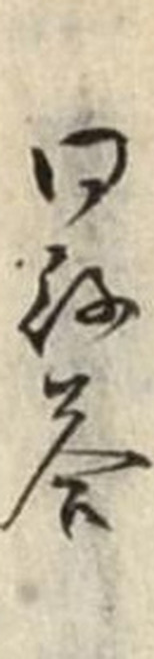同役答
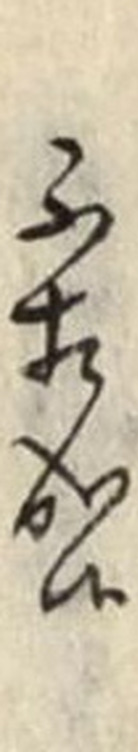不相成候
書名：養子縁組之部
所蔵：福井県文書館 Fukui Prefectural Archives
